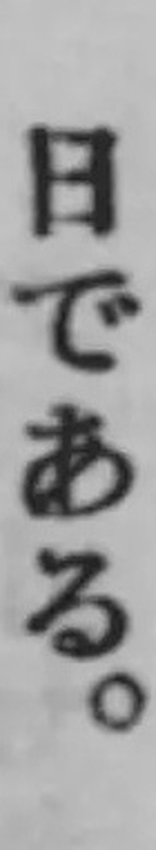日である。
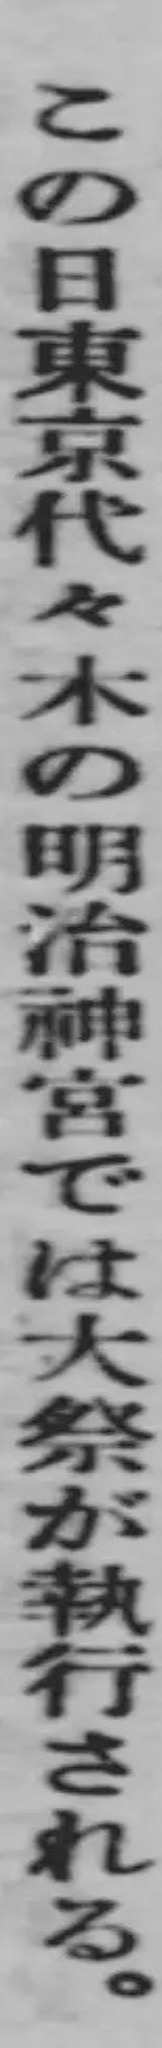この日東京代々木の明治神宮では大祭が執行される。

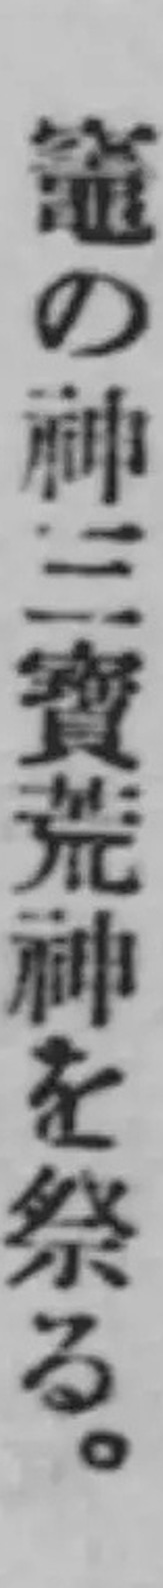竈の神三寶荒神を祭る。
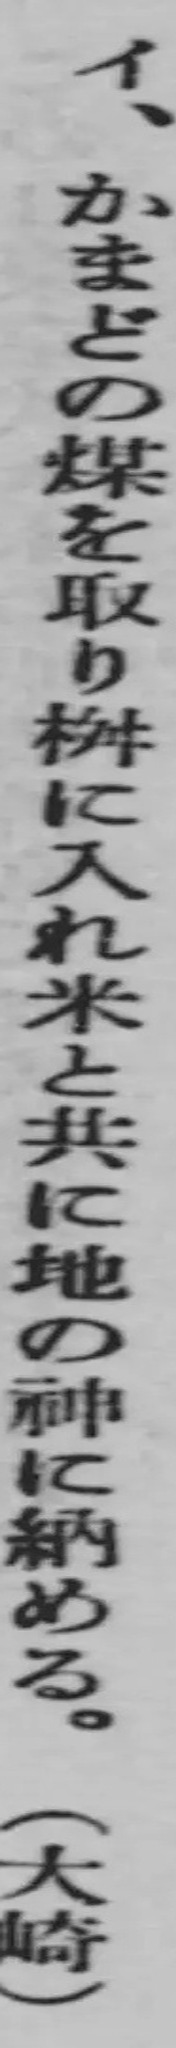イ、かまどの煤を取り桝に入れ米と共に地の神に納める。(大崎)
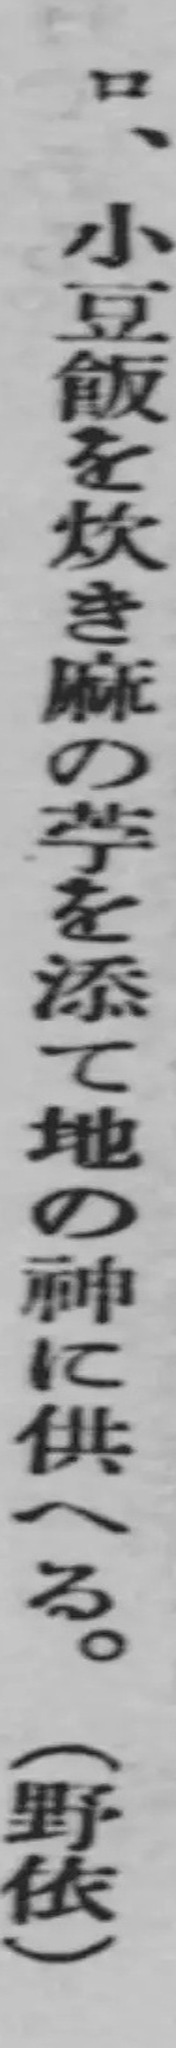ロ、小豆飯を炊き麻の苧を添て地の神に供へる。(野依)
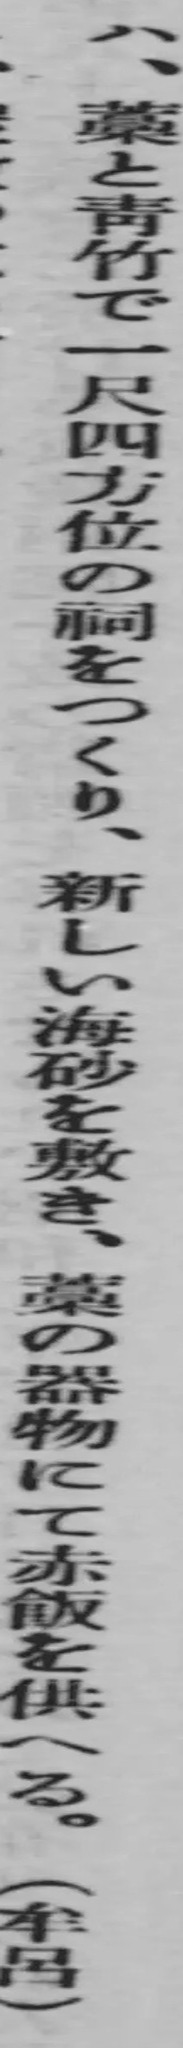ハ、藁と靑竹で一尺四方位の祠をつくり、新しい海砂を敷き、藁の器物にて赤飯を供へる。(牟呂)
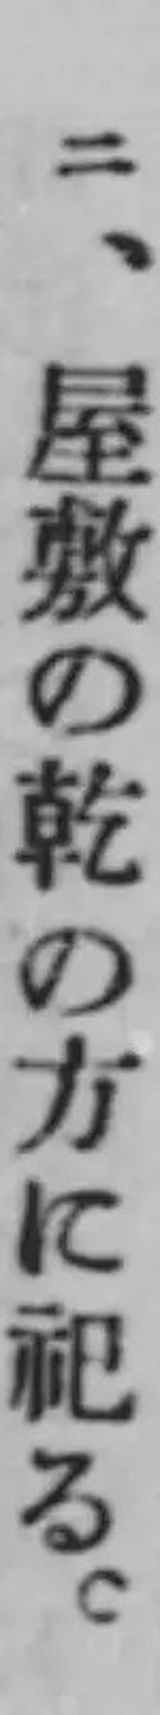ニ、屋敷の乾の方に祀る。(植田)
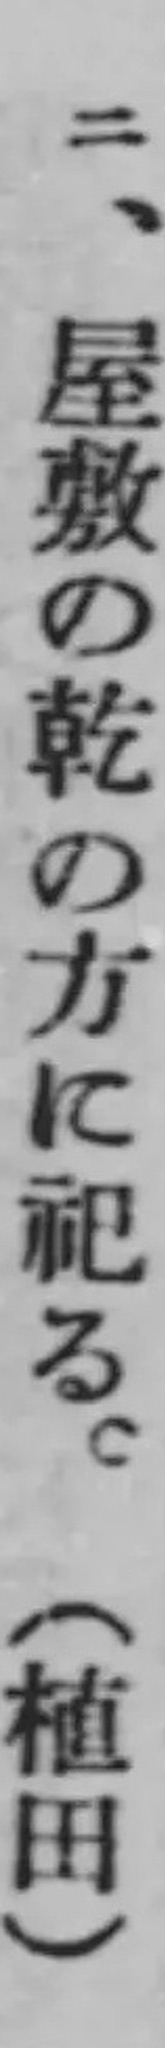ニ、屋敷の乾の方に祀る。(植田)
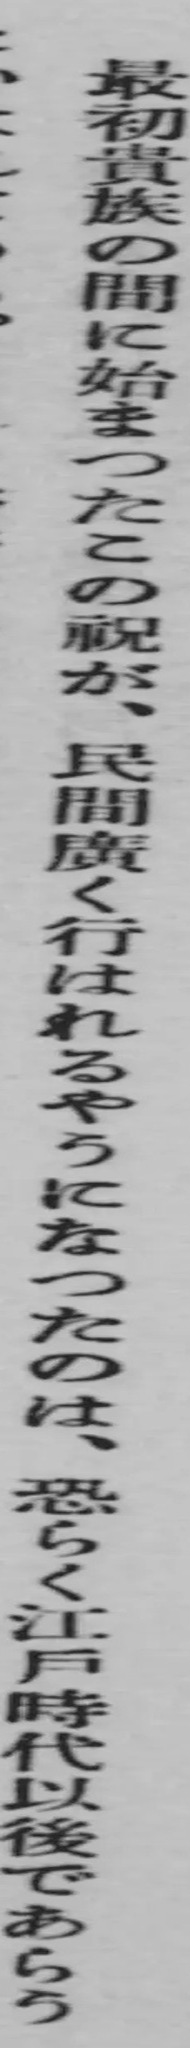最初貴族の間に始まつたこの祝が、民間廣く行はれるやうになつたのは、恐らく江戸時代以後であらう
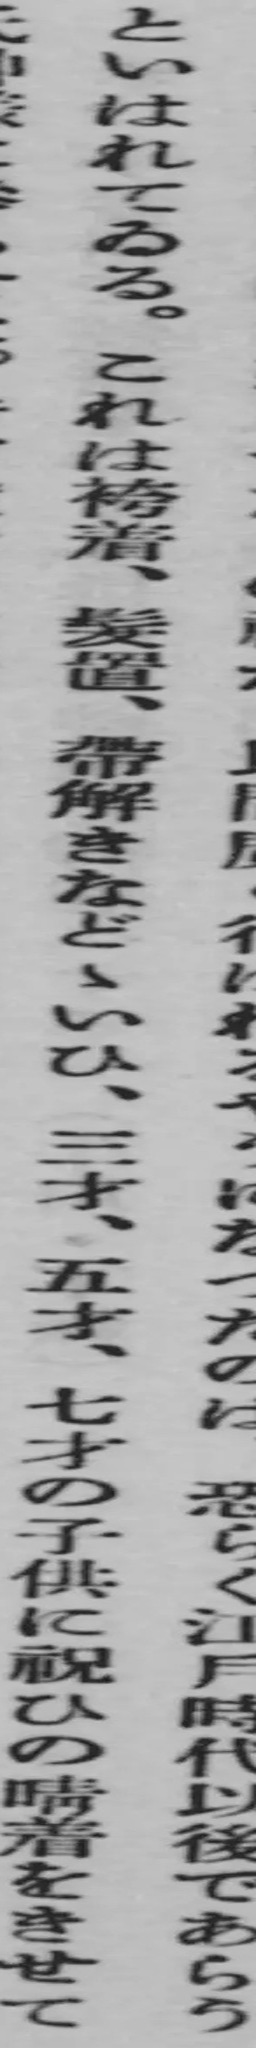といはれてゐる。これは袴着、髪置、帶解きなどゝいひ、三才、五才、七才の子供に祝ひの晴着をきせて
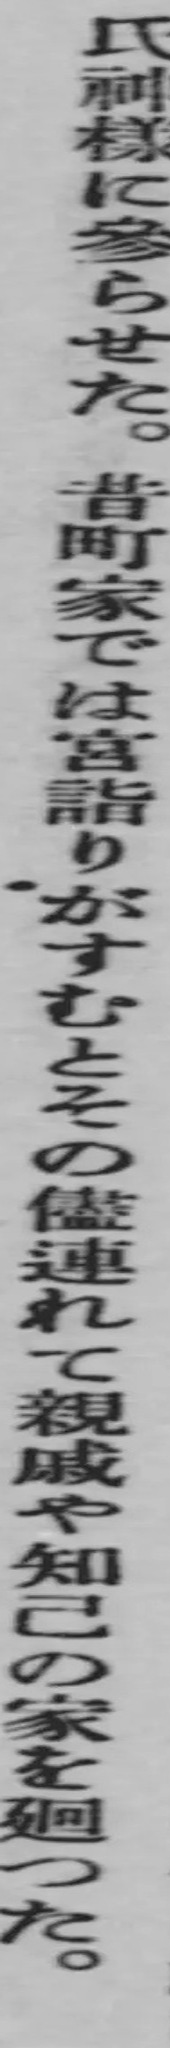氏神様に參らせた。昔町屋では宮詣りがすむとその儘連れて親戚や知己の家を廻つた。
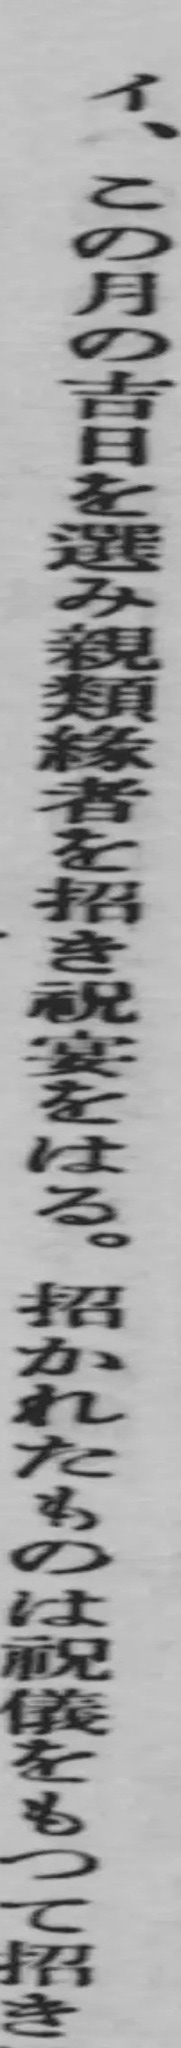イ、この月の吉日を選み親類緣者を招き祝宴をはる。招かれたものは祝儀をもつて招きに應ず。(福岡)
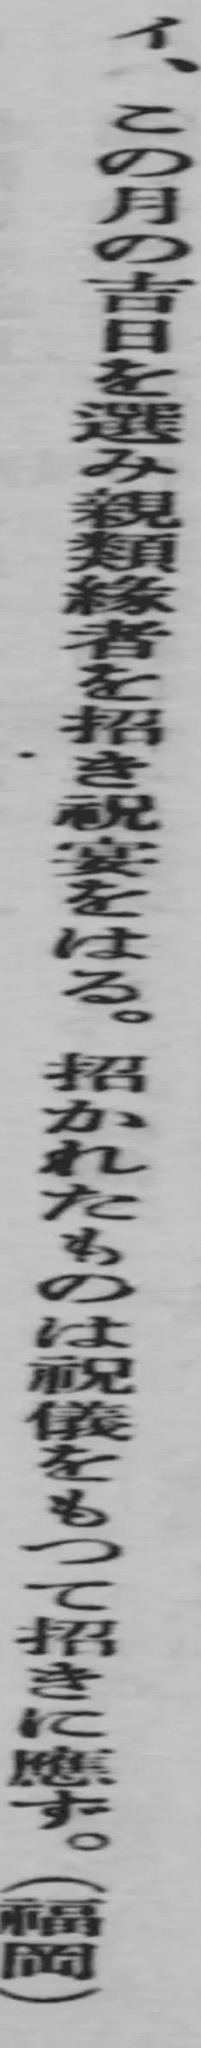イ、この月の吉日を選み親類緣者を招き祝宴をはる。招かれたものは祝儀をもつて招きに應ず。(福岡)
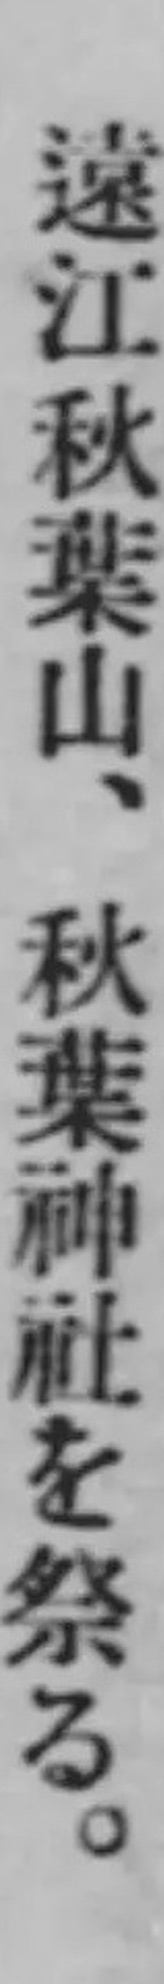遠江秋葉山、秋葉神社を祭る。
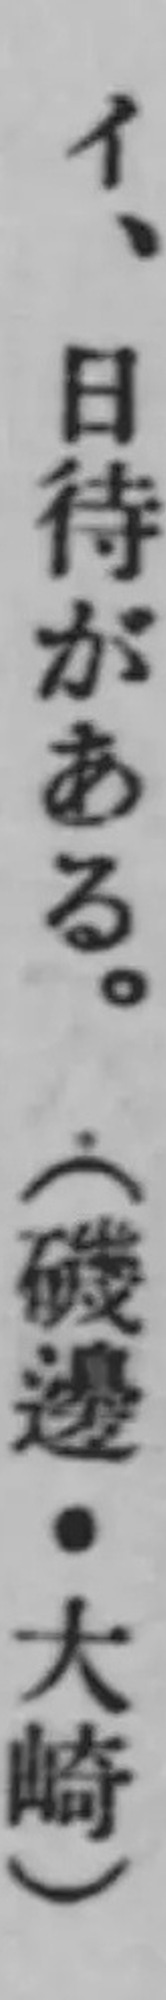イ、日待がある。(磯邊・大崎)
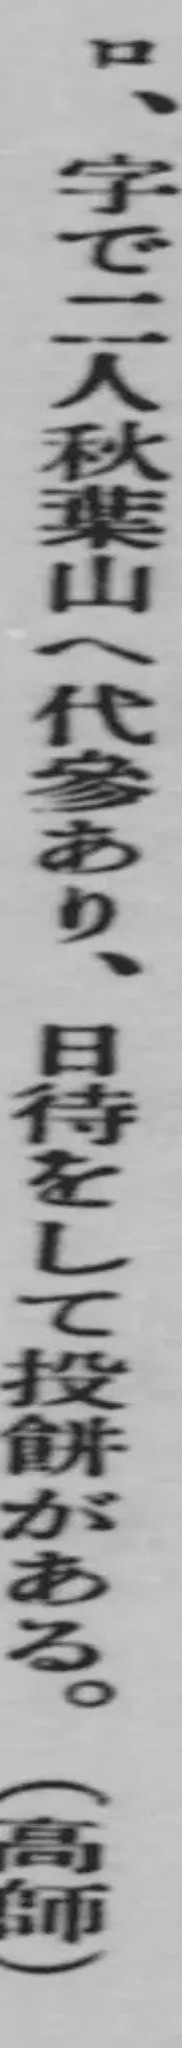ロ、字で二人秋葉山へ代參あり、日待をして投餅がある。(高師)
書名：豊橋の年中行事
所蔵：国立国会図書館 National Diet Library, JAPAN
